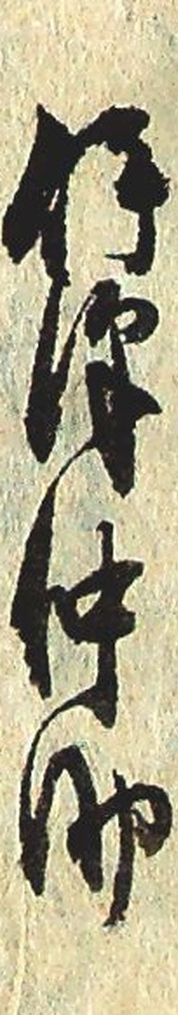伊沢仲助
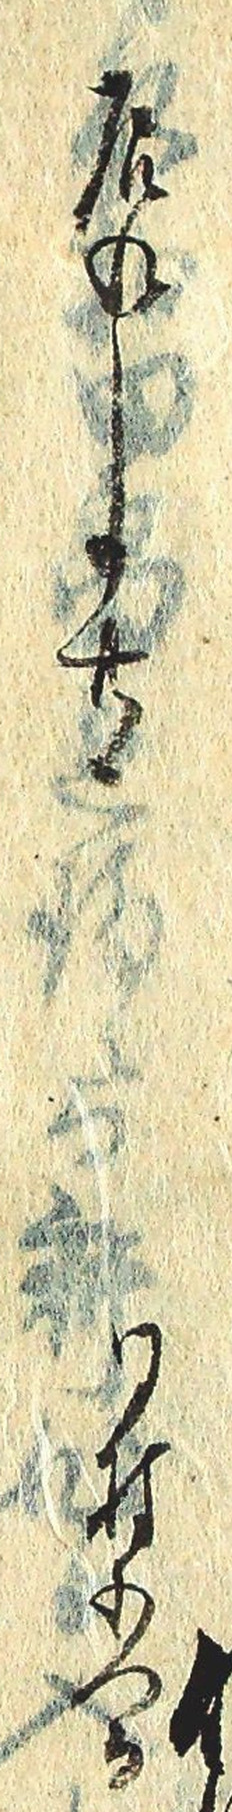辰九月廿日同村五人与
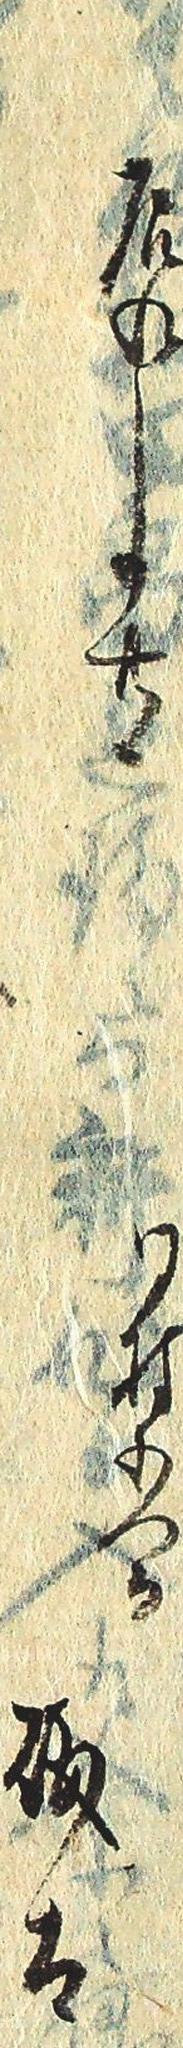辰九月廿日同村五人与
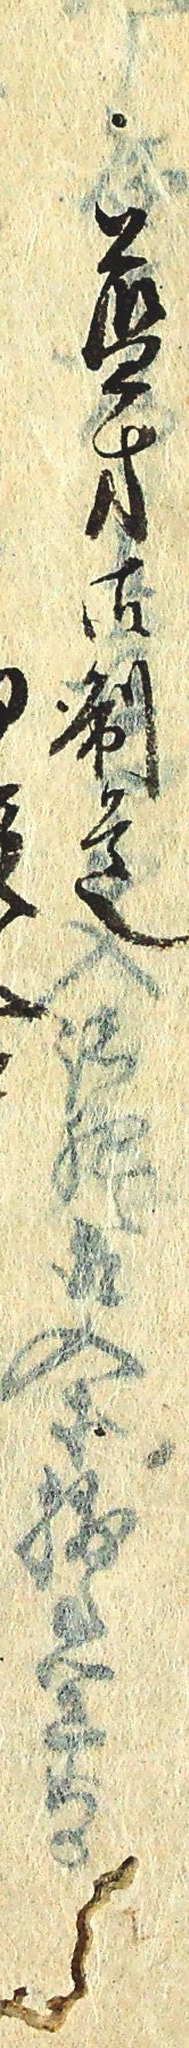藍方御制道
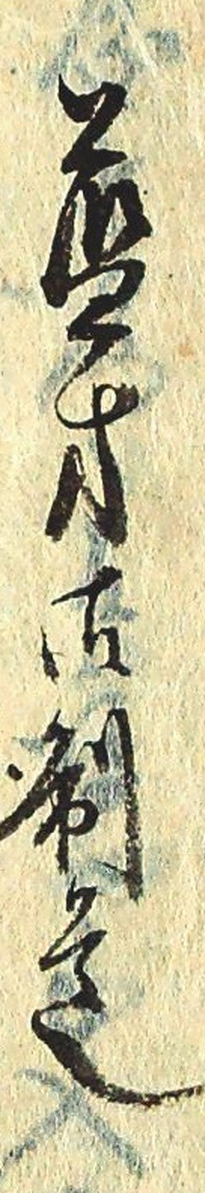藍方御制道
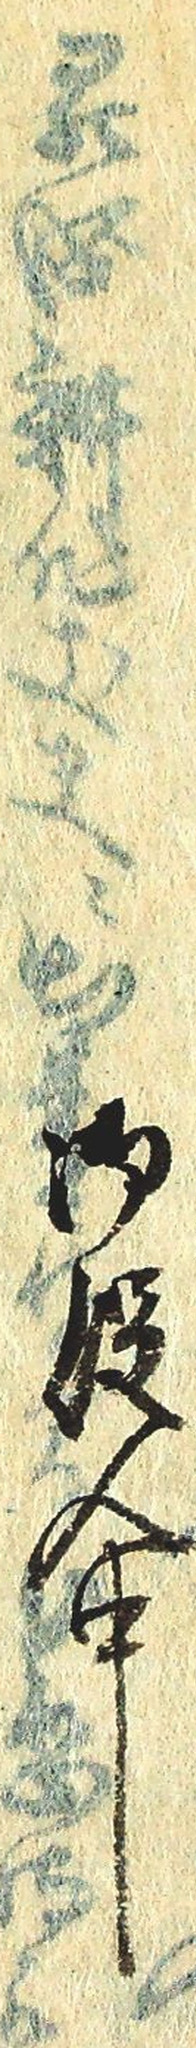御役人中
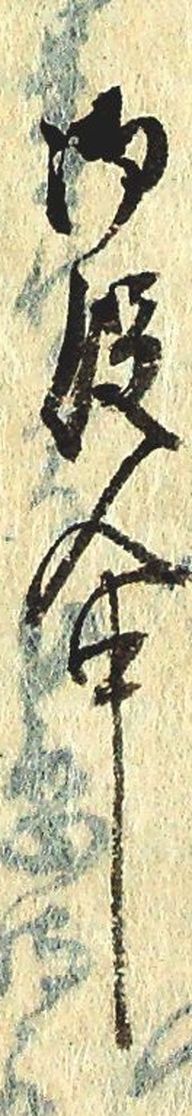御役人中
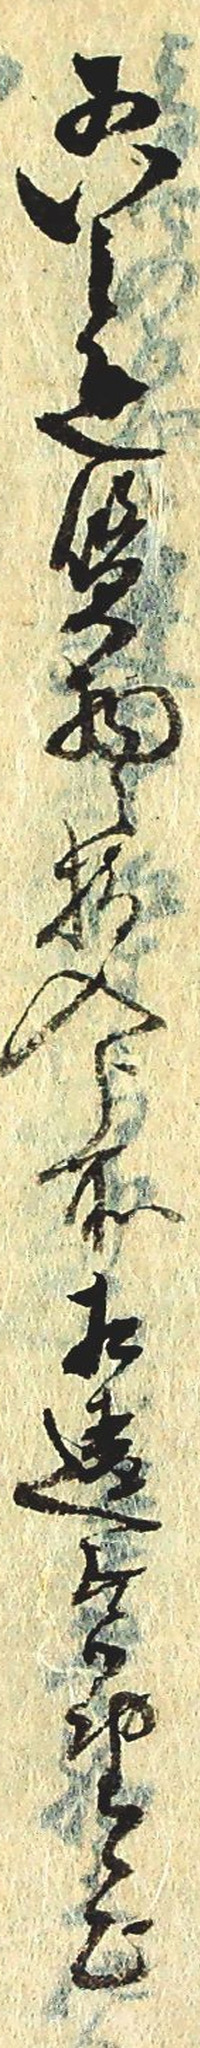右之通質物に指入申所相違無御座候以上
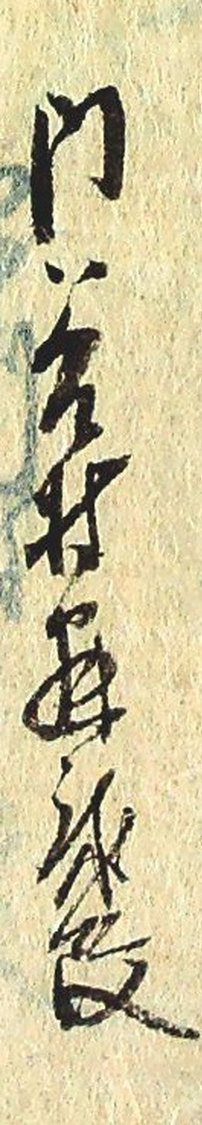内谷村寐床改
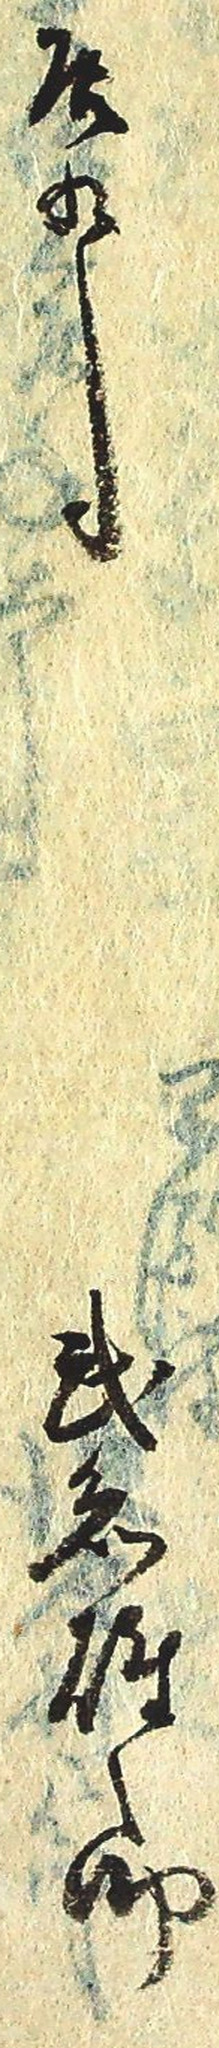辰九月武知雄之助
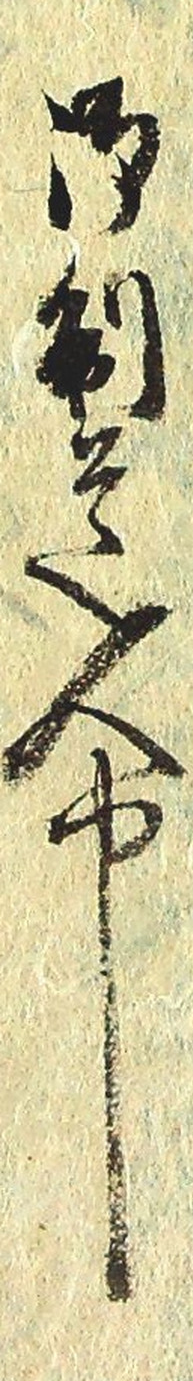御制道人中

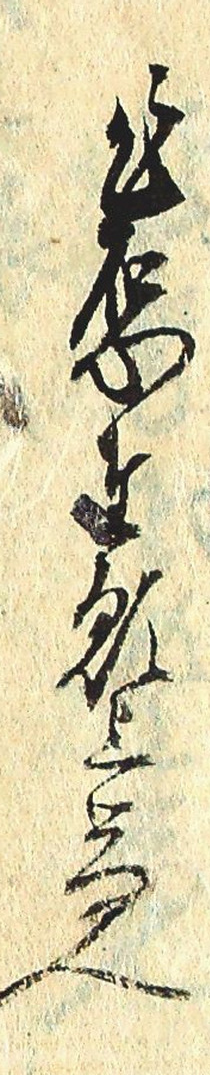乍恐奉願上覚
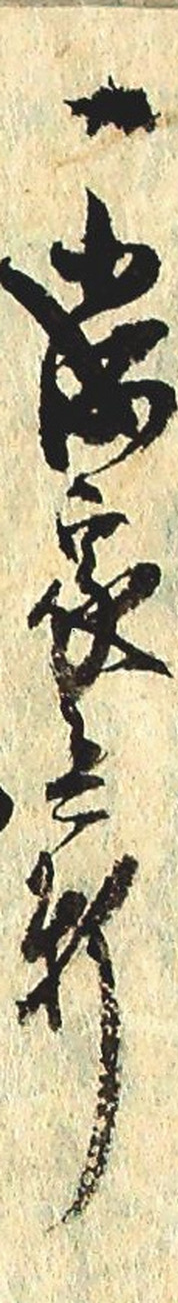一小成家壱軒礎
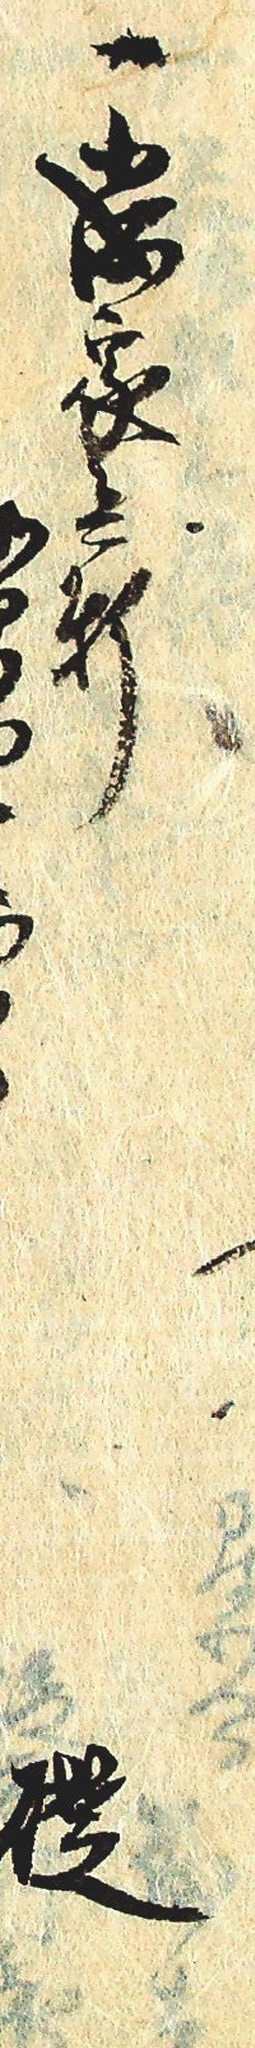一小成家壱軒礎
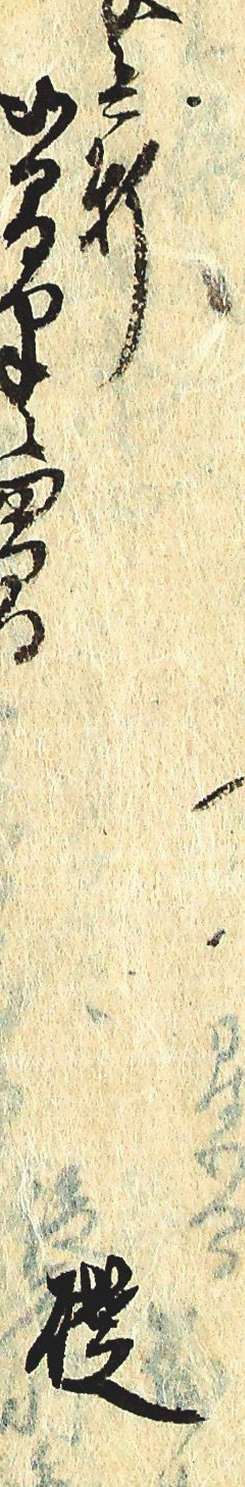弐間半に四間
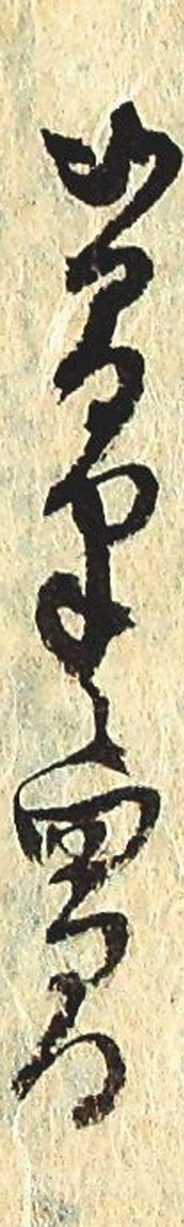弐間半に四間
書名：諸御願書控(弐番）
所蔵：鳴門教育大学 Naruto University of Education
